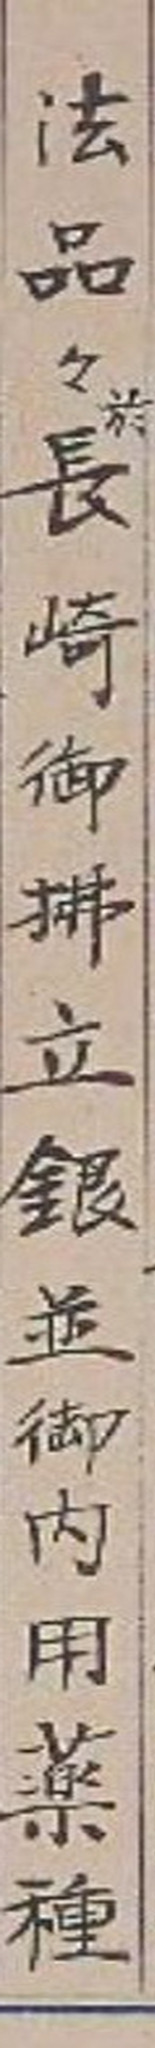法品々於長崎御拂立銀並御内用薬種
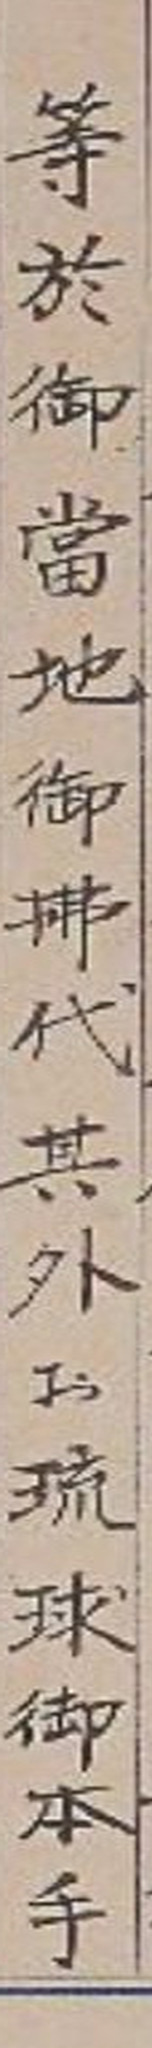等於御當地御拂代其外於琉球御本手
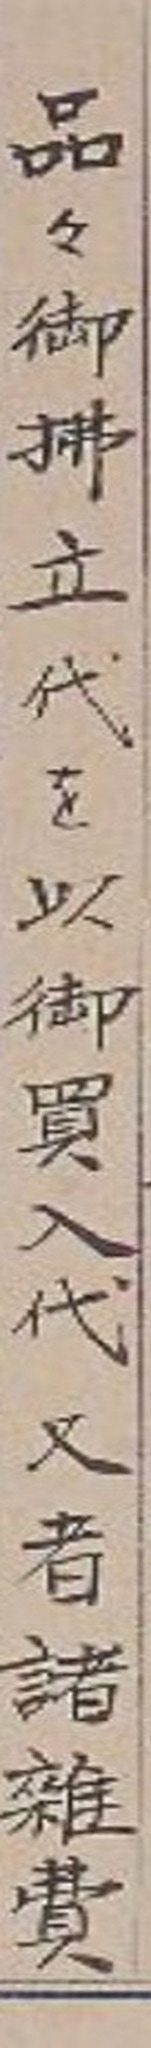品々御拂立代を以御買入代又者諸雜費
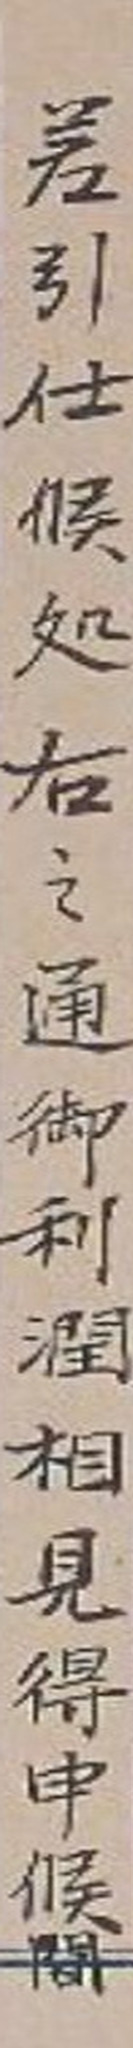差引仕候処右も通御利潤相見得申候間
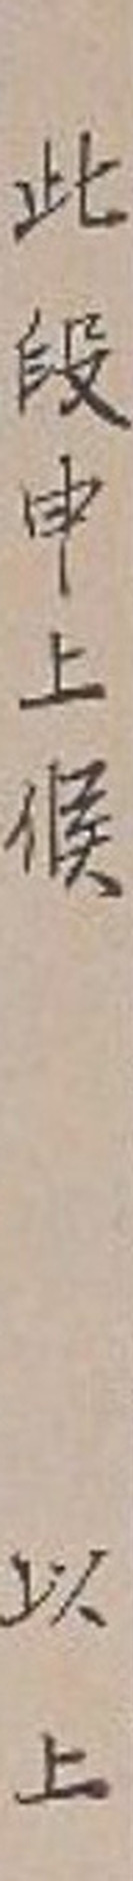此段申上候以上
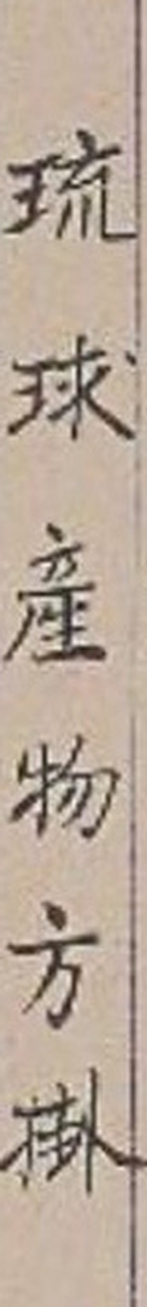琉球産物方掛

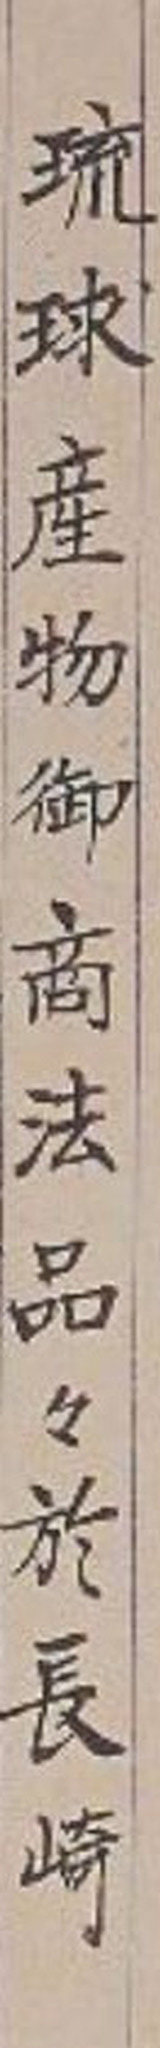琉球産物商法品々於長崎
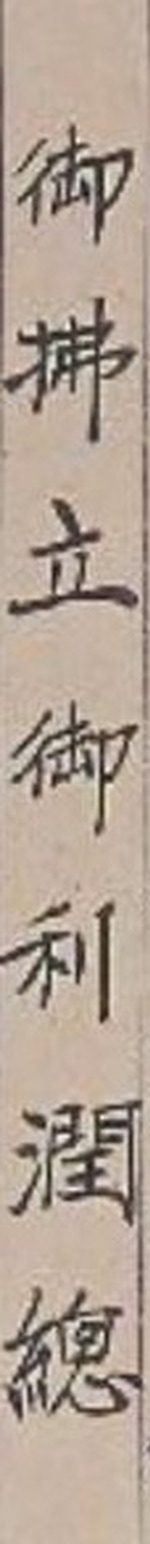御拂立御利潤總
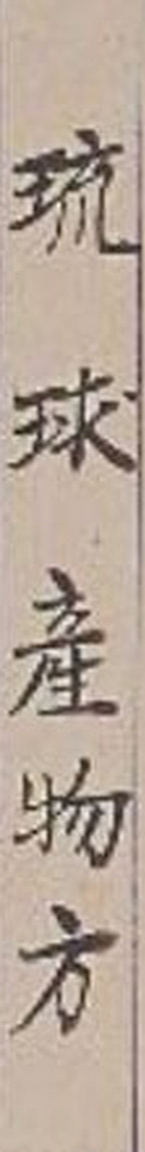琉球産物方

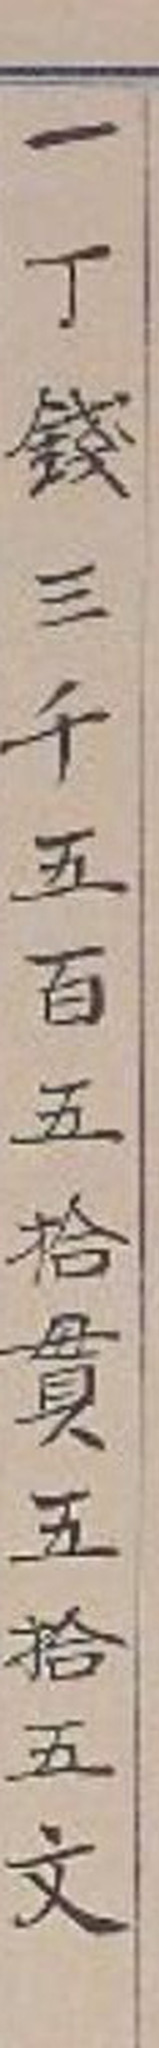一丁錢三千五百五拾貫五拾五文
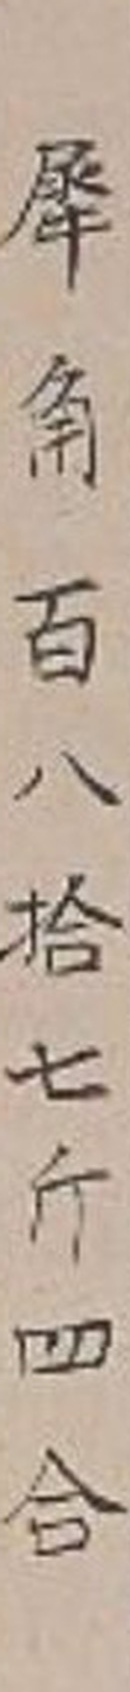犀角百八拾七斤四合
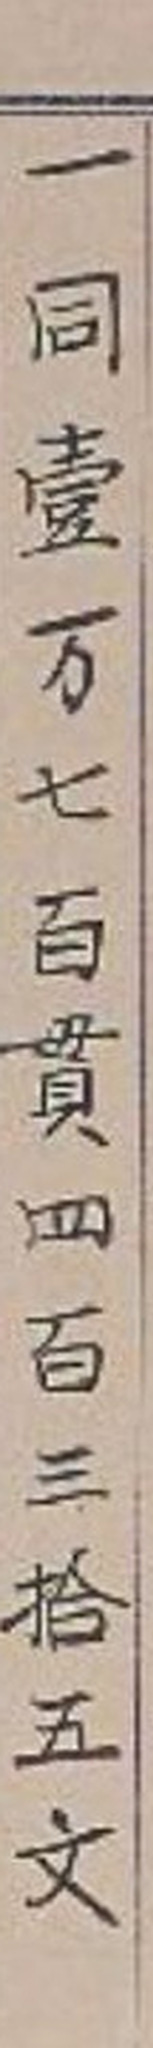一同壹万七百貫四百三拾五文
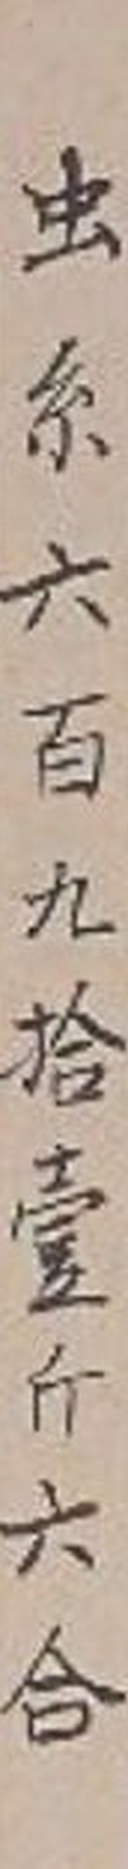虫糸六百九拾壹斤六合
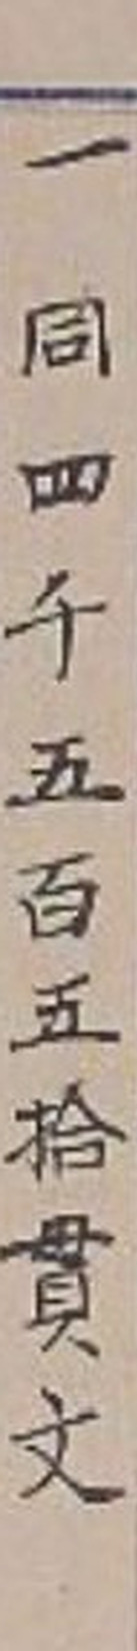一同四千五百五拾貫文
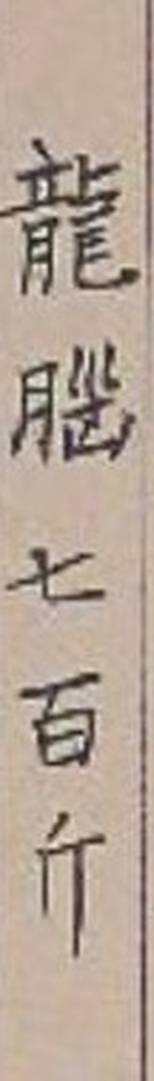龍腦七百斤
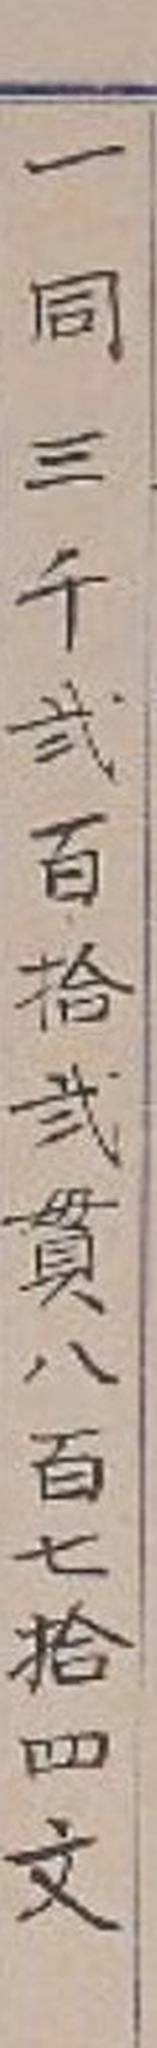一同三千弐百拾弐貫八百七拾四文
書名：琉球産物於長崎拂立並本手品利潤総帖 弘化四年より酉年迄
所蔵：University of the Ryukyus Library
